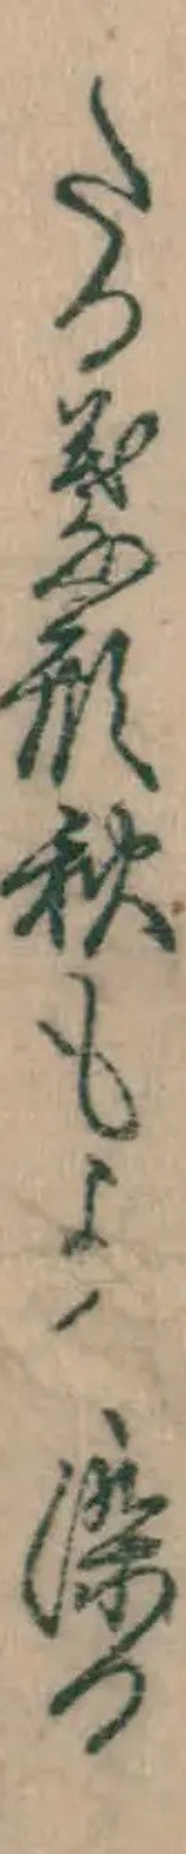たる葉形秋もよく染る
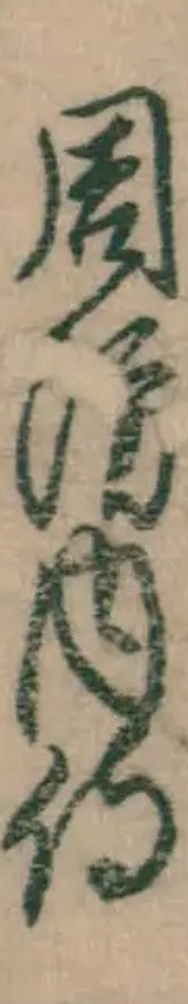周防内侍
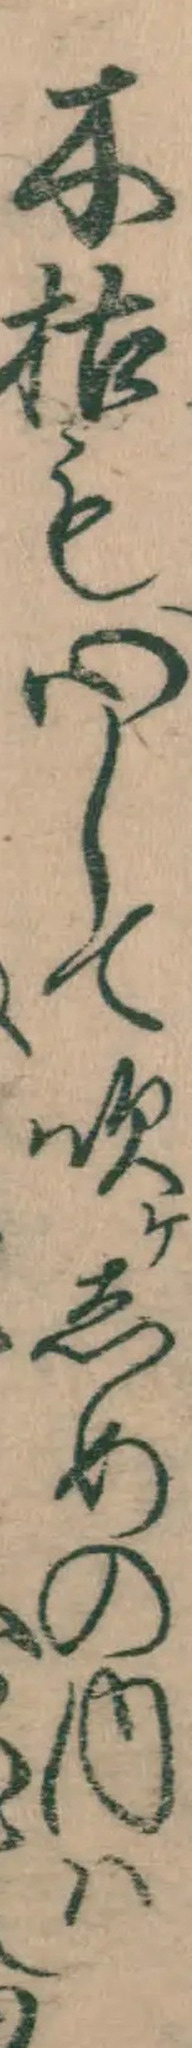木枯も心して吹ヶ志めの内は
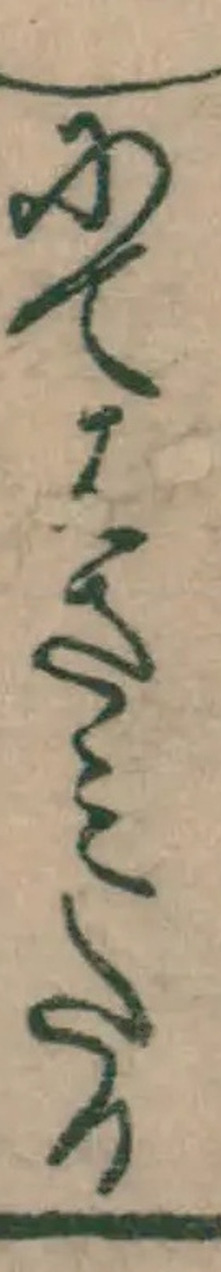にてはさみたる

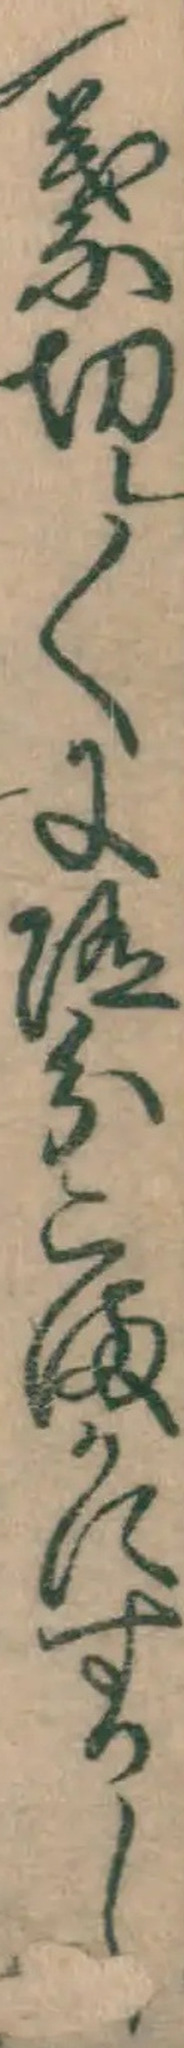切錦葉切レ〳〵に随分こまかにすかし
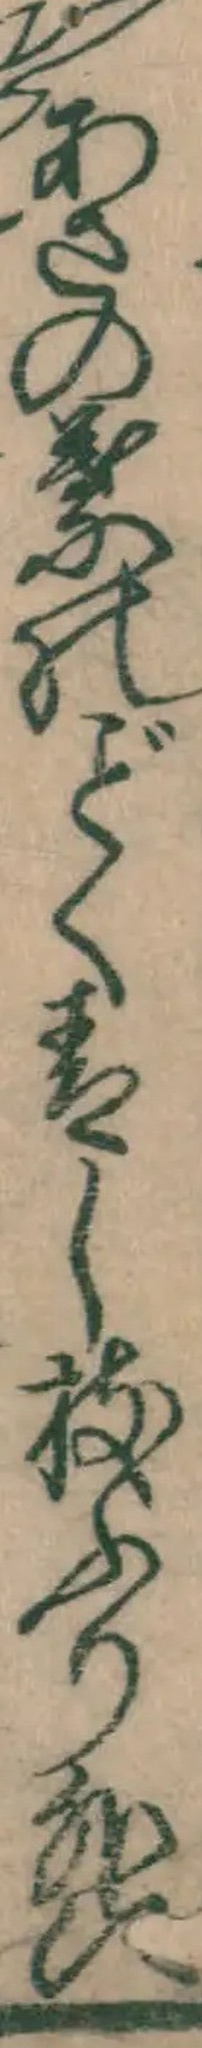あさの葉のごとく青し枝ふり外に
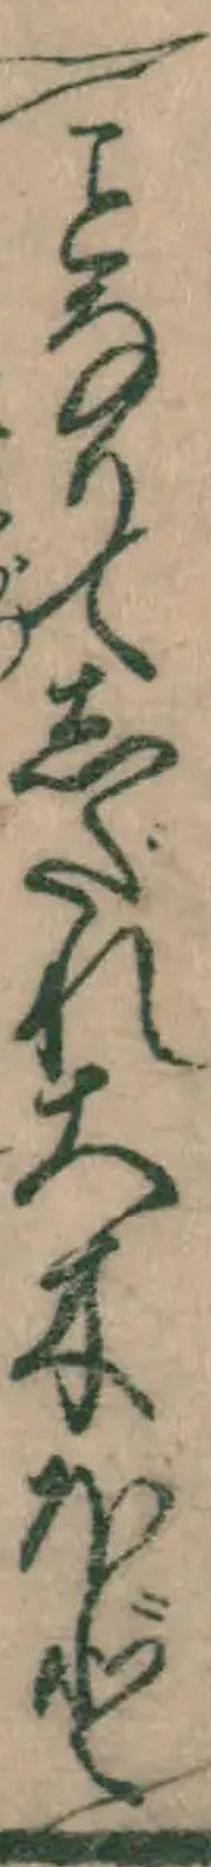ことなりてしだれ大木ほど
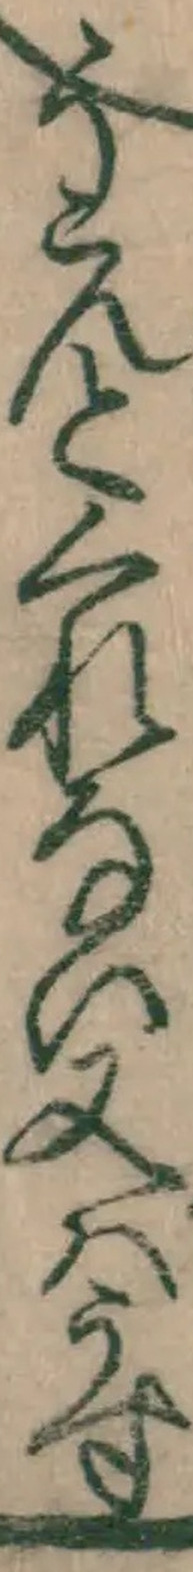のうこんとくれない又はうす
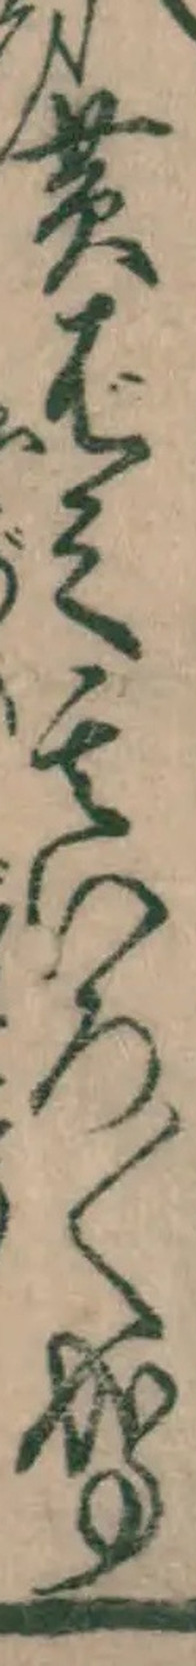黄ばみ其いろ〳〵成事
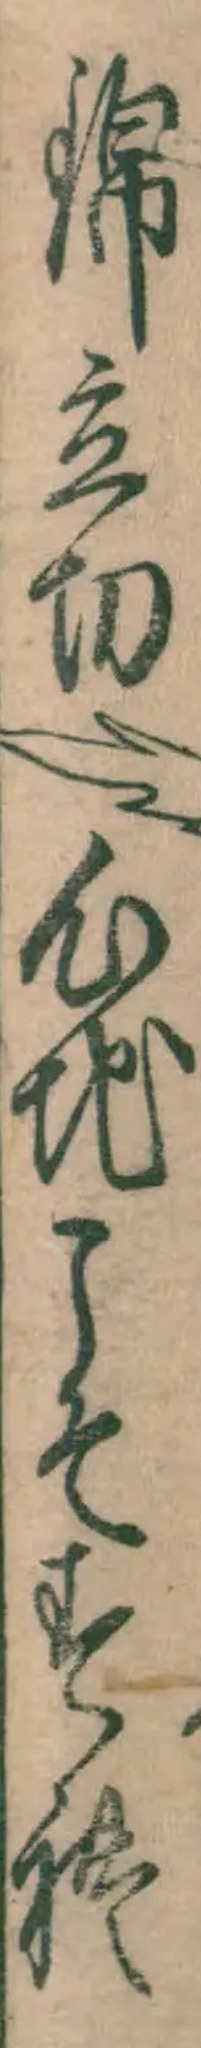錦立切心地こそすれ
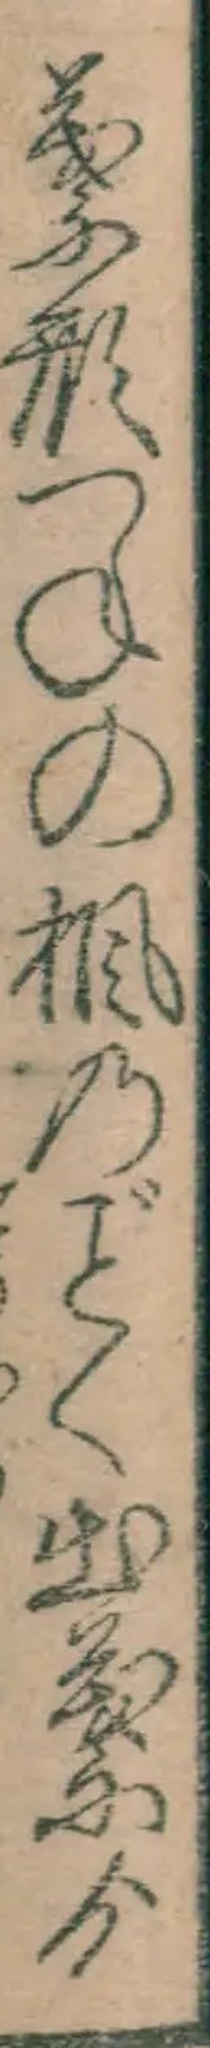青葉葉形つねの楓のごとく出葉ゟ
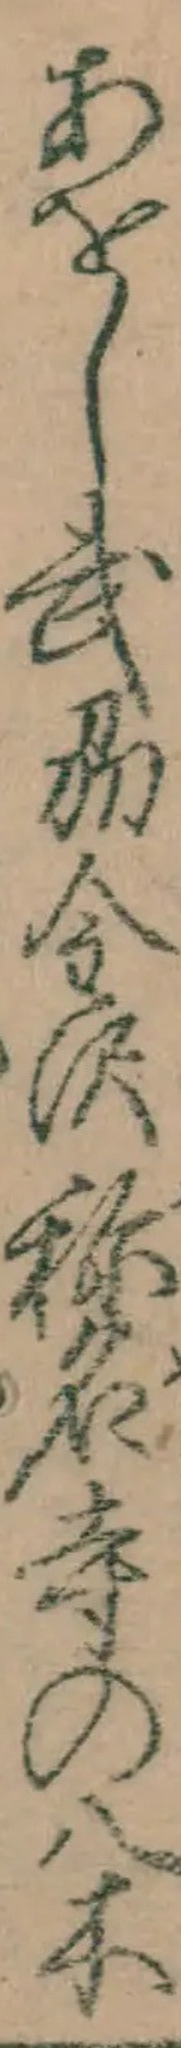あをし武州金沢称名寺の八木
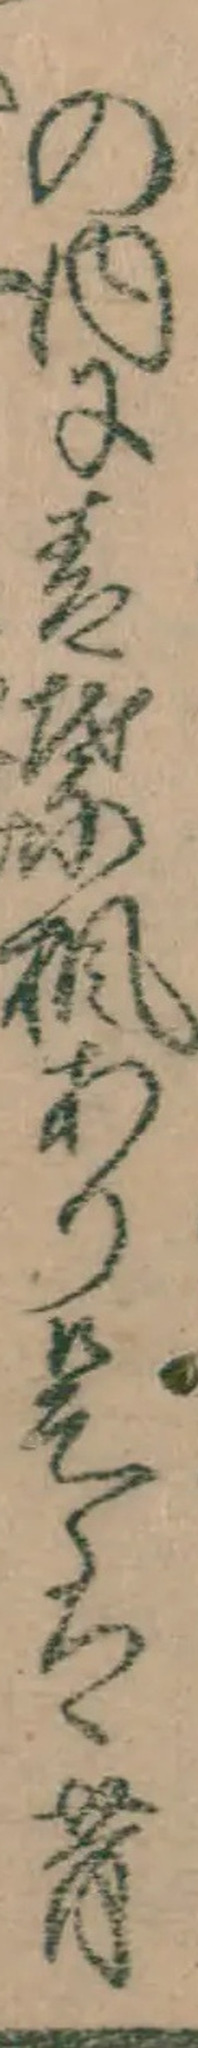の内に青葉楓あり是は昔
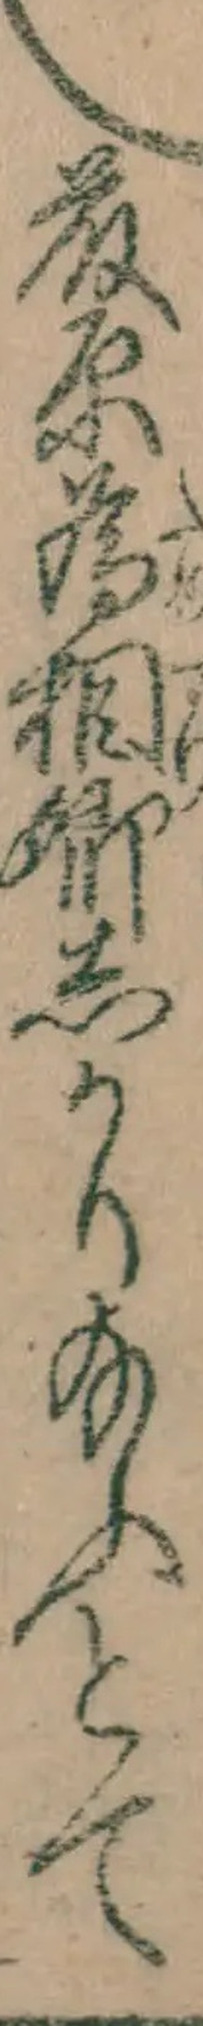藤原為相卿しかり給ふとて
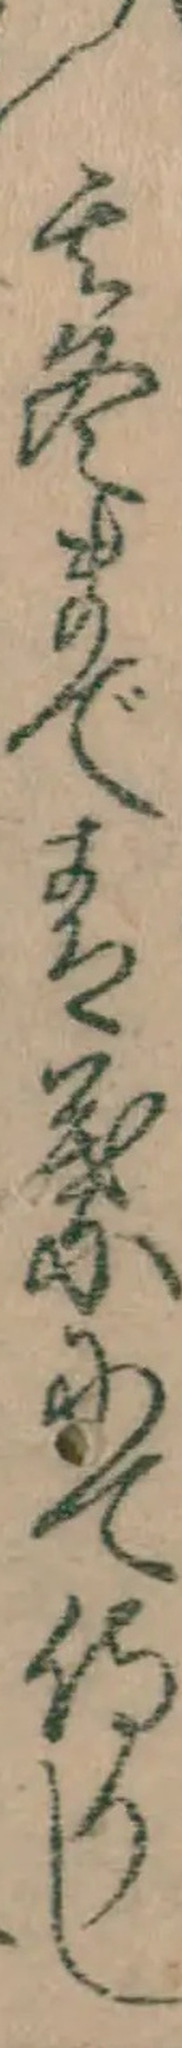其冬まで青葉にて侍りし
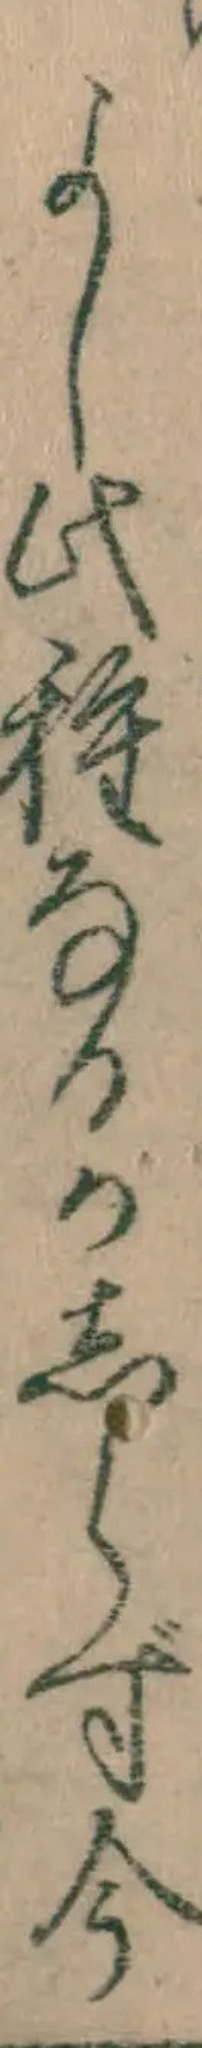よし此種なるかしらず今
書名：紅葉集
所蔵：国立国会図書館 National Diet Library, JAPAN
